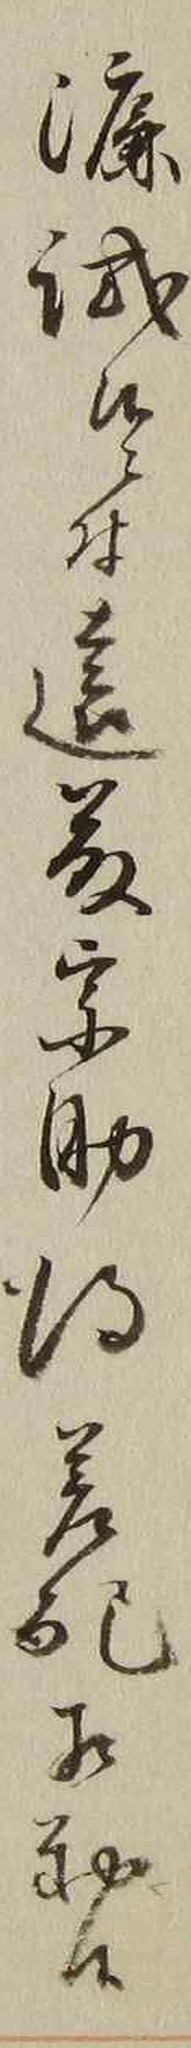漉試候ニ付遠藤宗助得差配相勤候
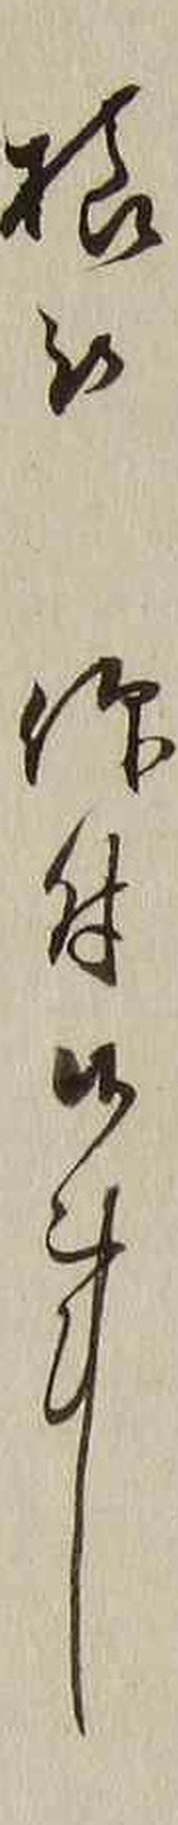様被仰付候事
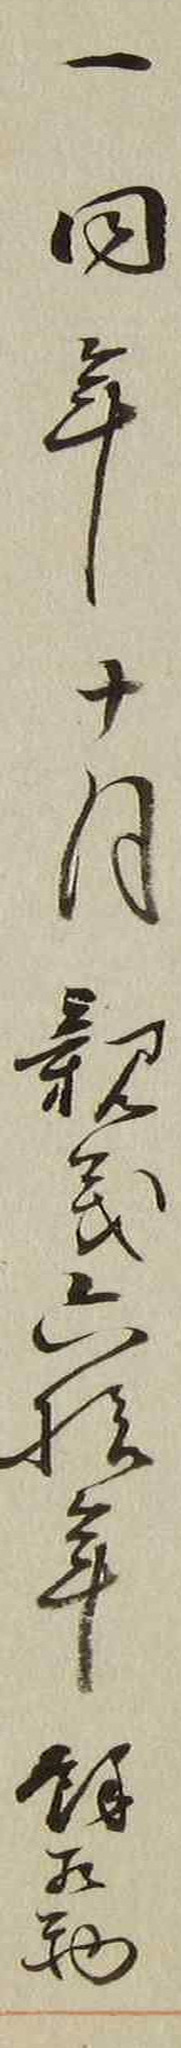一同年十月親義六拾年余相勤
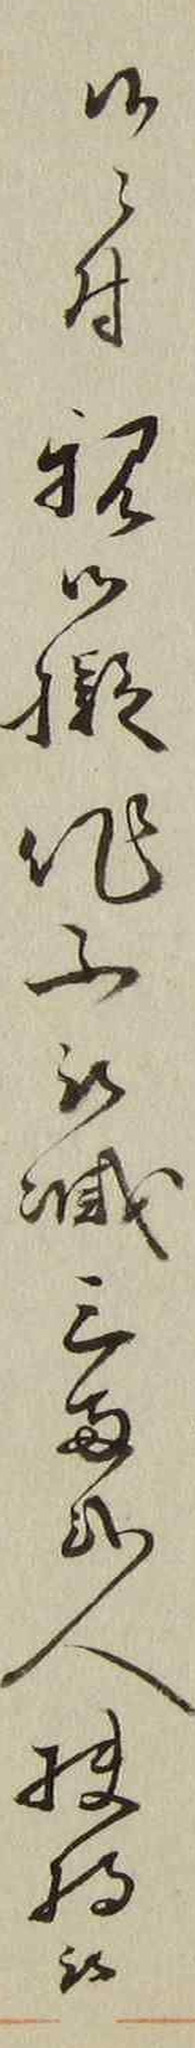候ニ付親御擬作不被減三両弐人扶将被
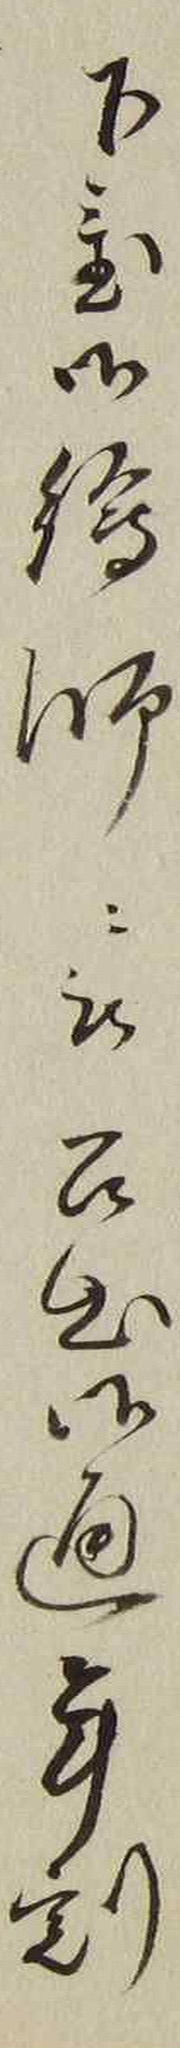下置御絵師ニ被召出御通年割
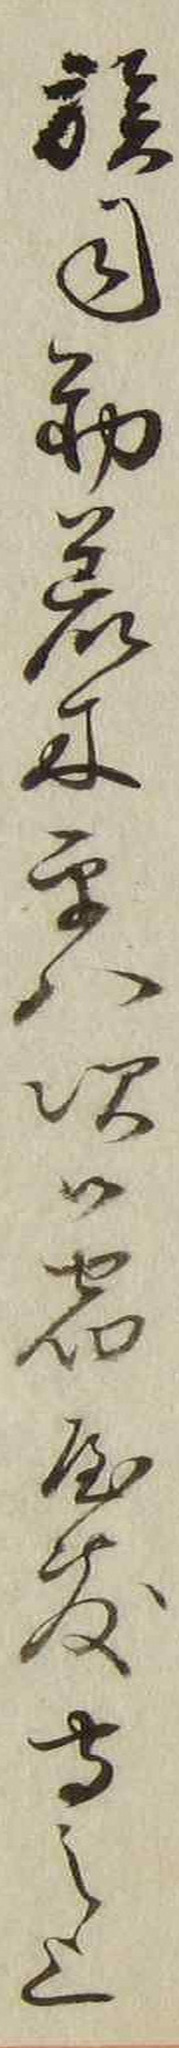族司勤荒木平八次御宿屋敷守之上

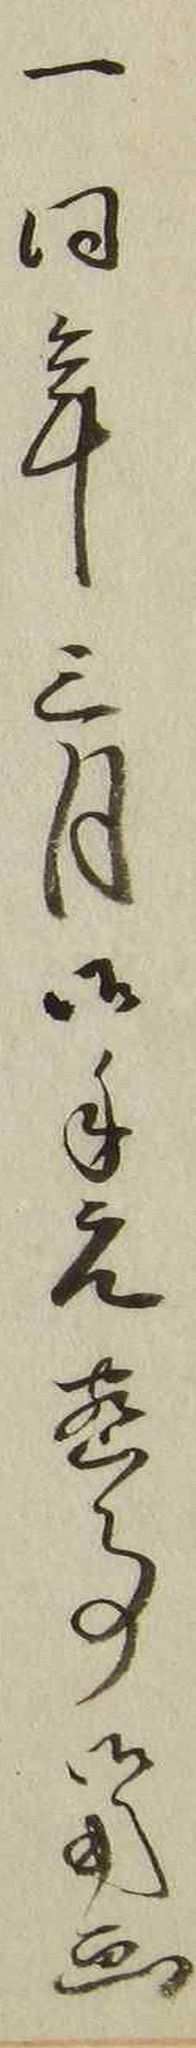一同年三月御手元密事御用画
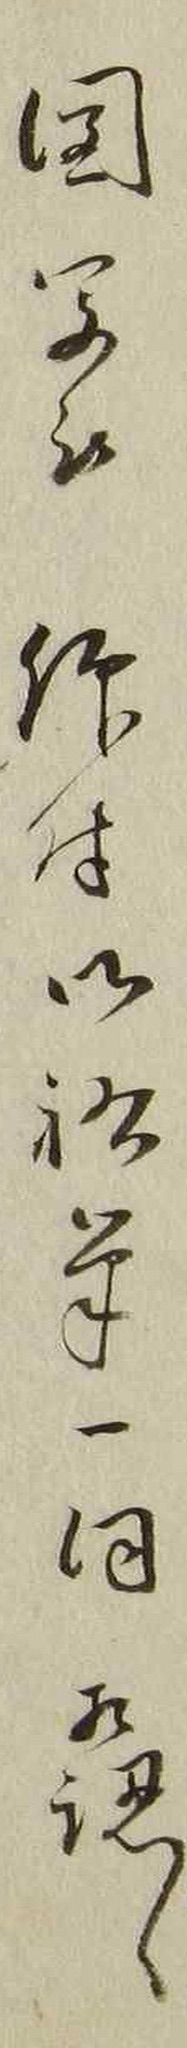図写被仰付御祐筆一同相認候
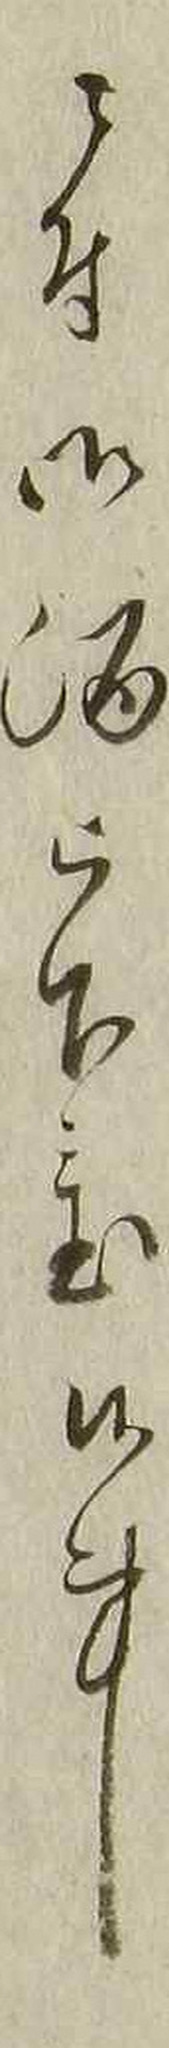ニ付御酒被下置候事
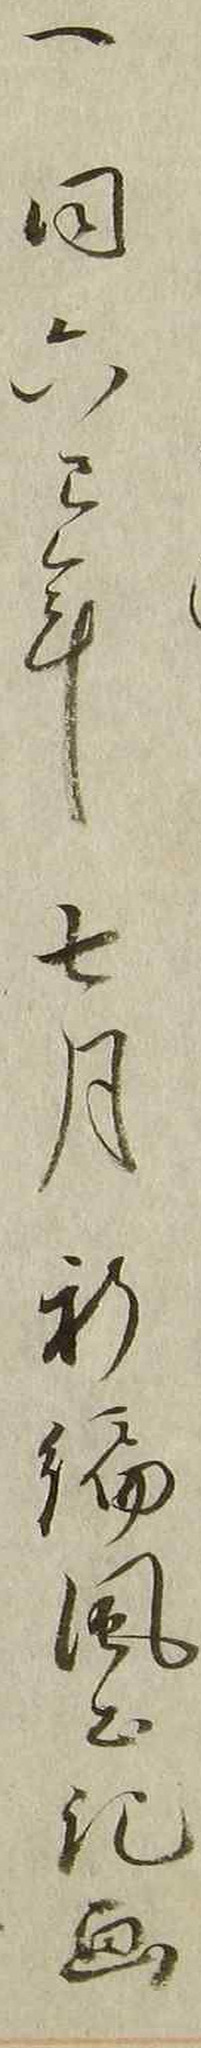一同六巳年七月新編風土記画
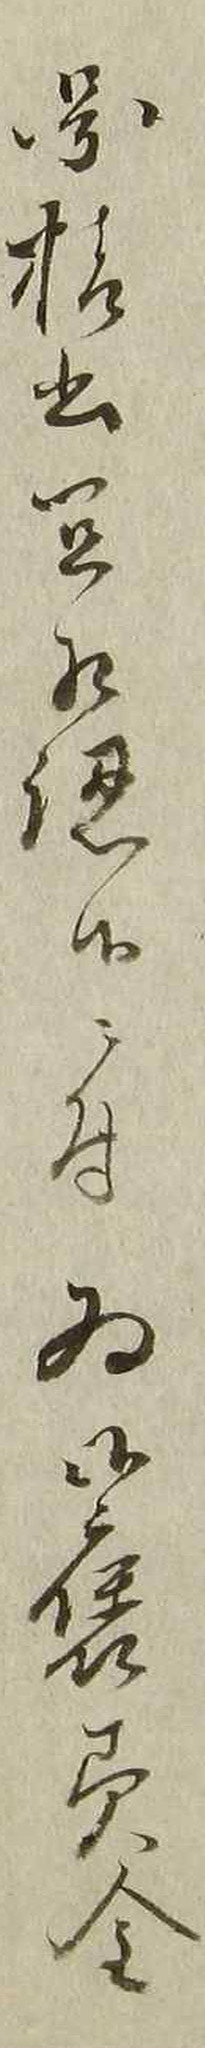図精出宜相認候ニ付為御褒美金
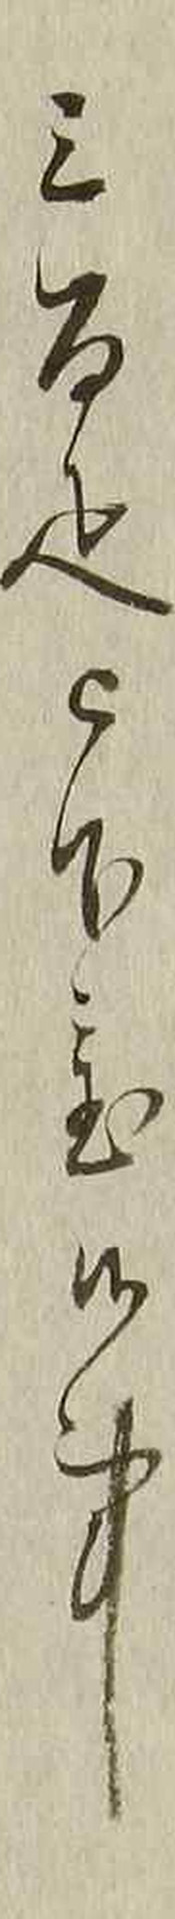三百疋被下置候事
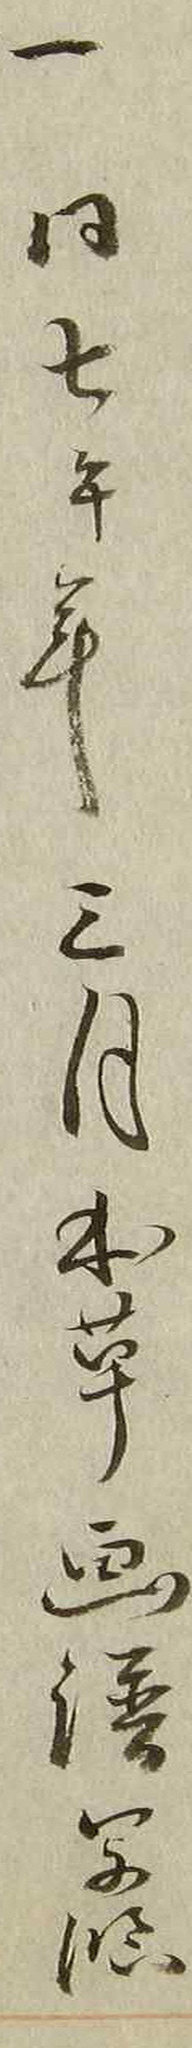一同七午年三月本草画譜写臨
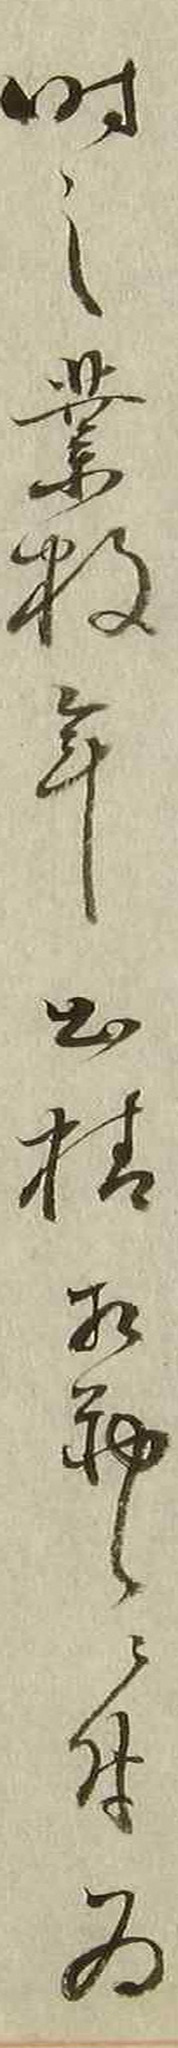時之業数年出精相勤候ニ付為
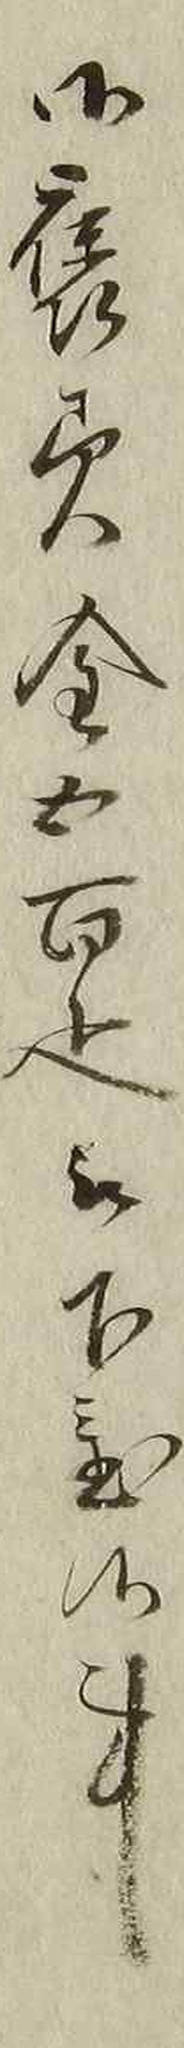御褒美金五百疋被下置候事
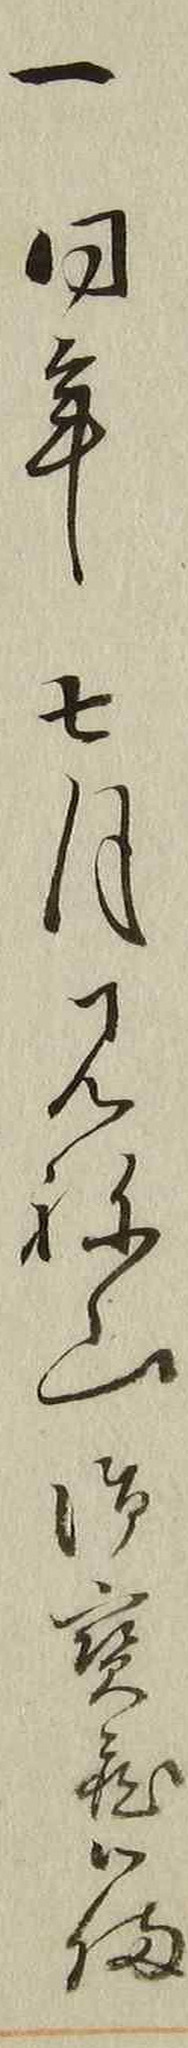一同年七月見祢山御宝蔵御備
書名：諸士系譜　巻之132　た之部8
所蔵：会津若松市立会津図書館
